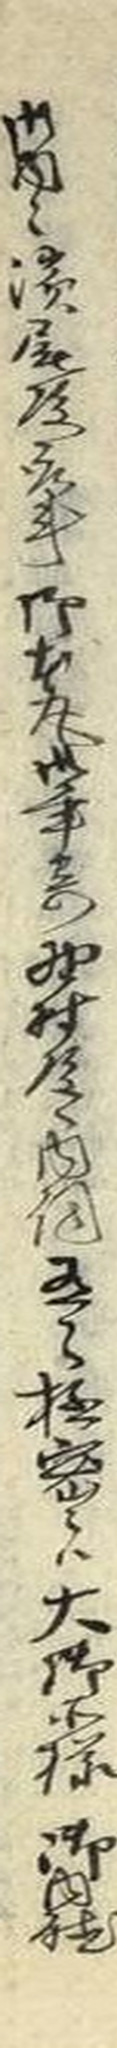御内々浜尾殿取計御本丸御年寄野村殿へ内伺有之極密ニハ大御所様御内聴
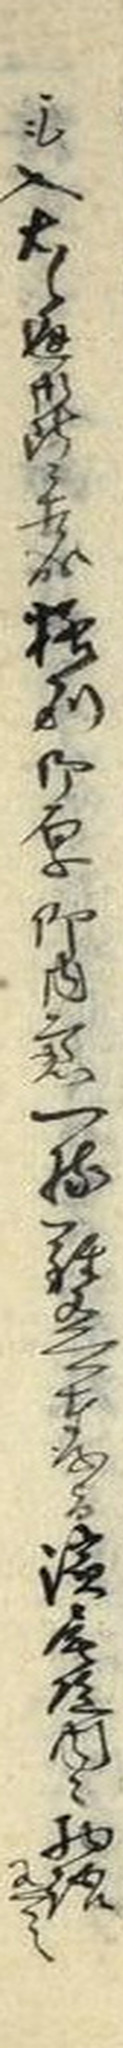も入右之通御断ニ相成格別御厚御内慮一統難有可奉存旨浜尾殿内々物語有之

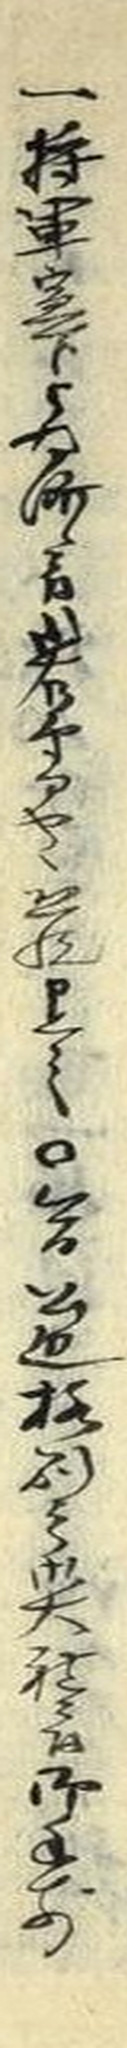一将軍宣下被為済候ニ付御右筆部屋へ恐悦申上之〇今日公辺格別之大礼ニ付御手前
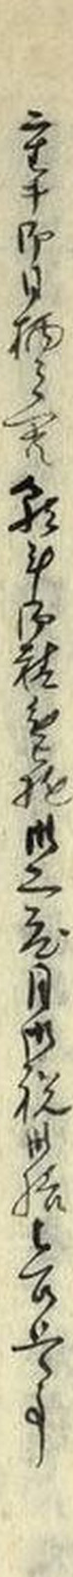重キ御日柄ニ候へ共朝斗御精進被遊御二度目御祝御膳被召上候事
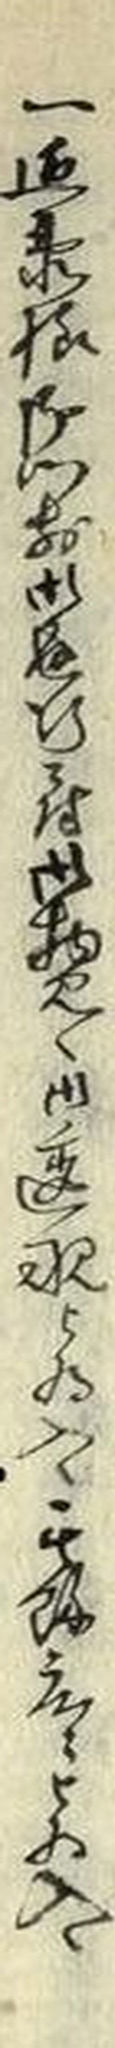一近衛様御門前御通行ニ付御物見へ御透覗被為入候其余度々被為入候
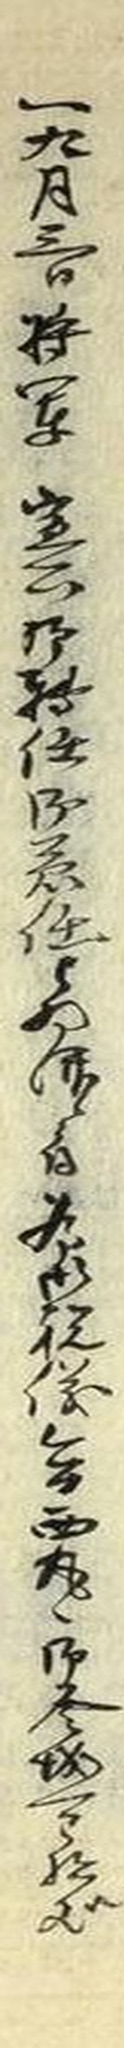一九月三日将軍宣下御転任御兼任被為済候ニ付為御祝儀今日西丸へ御登城可被遊処
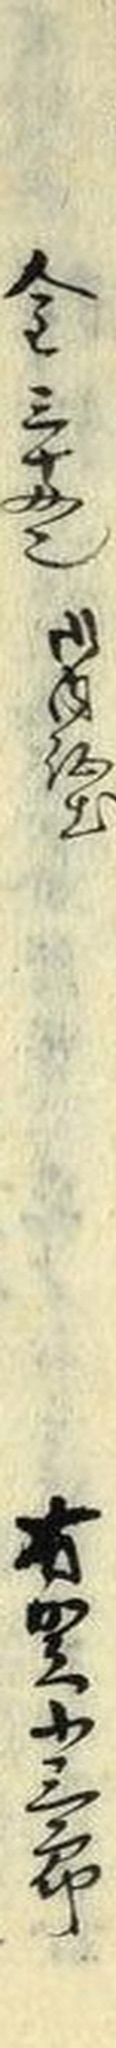金三十両也御内証出有賀小三郎
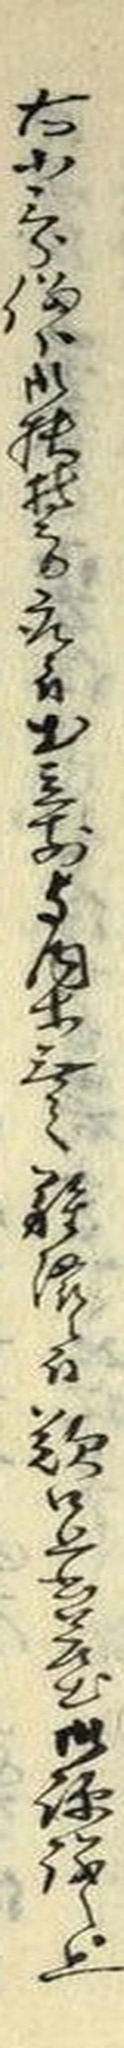右小三郎儀ハ扶持方取ニ付出立前与内等無之難渋ニ付歎口上書差出御評議之上
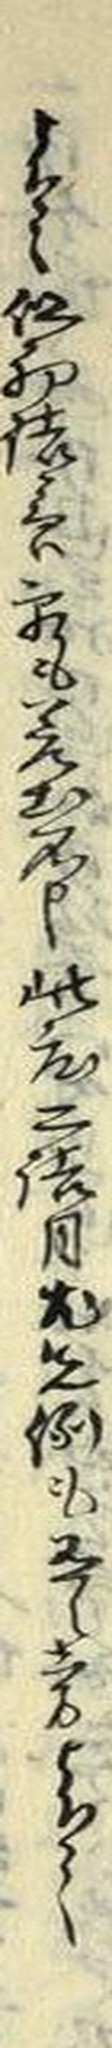被下之但初詰ニ而ハ願も差出不申此度二詰目尤先例も有之旁被下之
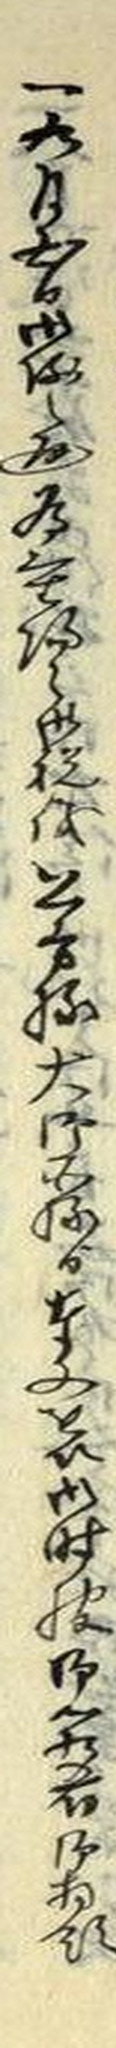一九月五日御例之通為重陽之御祝儀公方様大御所様ゟ奉文を以御時服御箱肴御拝領
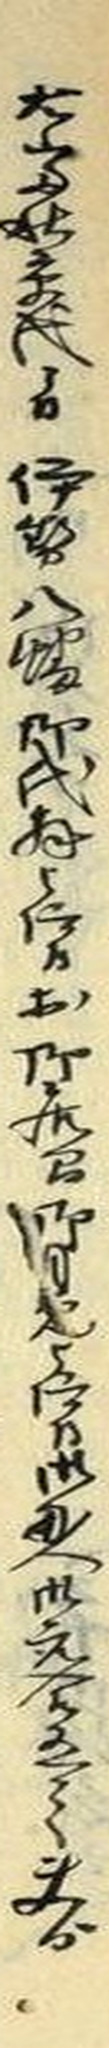右当秋交代ニ付伊勢八幡御代拝被仰付於御居間御目見被仰付御用人取合有之夫ゟ
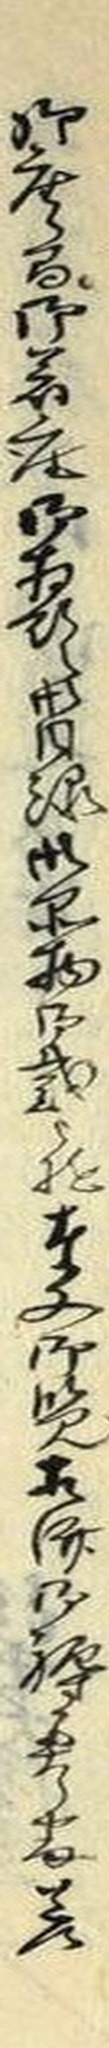御座之間御着座御拝領之御目録御品物御戴被遊奉文御覧相済御褥奥之番差
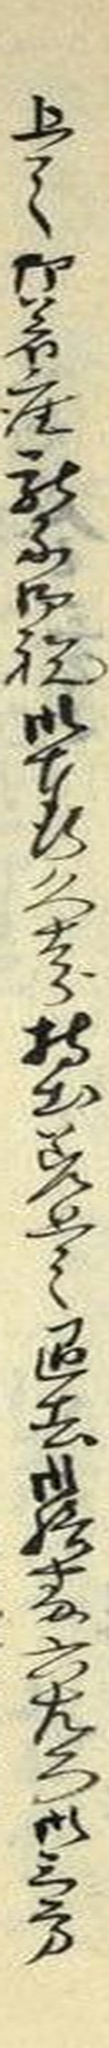上之御着座新米御祝御奉行久太郎持出差上之退去御膳番六左衛門御三方
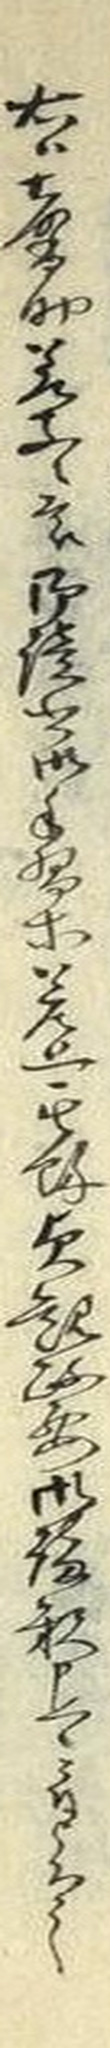右ハ馨助差支候節御読書御手習等差上其余貞観政要御講釈申上候ニ付被下之
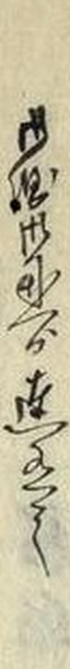御側御用人ゟ達有之
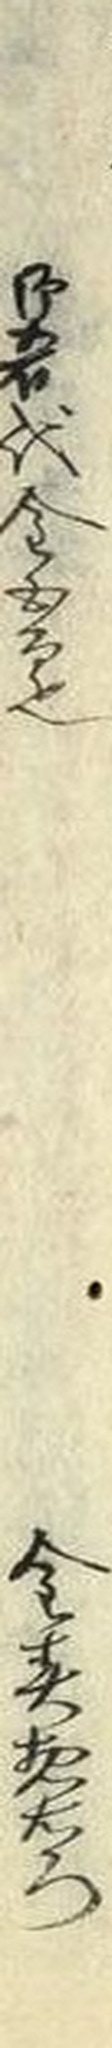御肴代金五百疋金春惣右衛門
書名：少傅日録抄（斉善付側向頭取日記、在府）
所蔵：福井県文書館 Fukui Prefectural Archives
